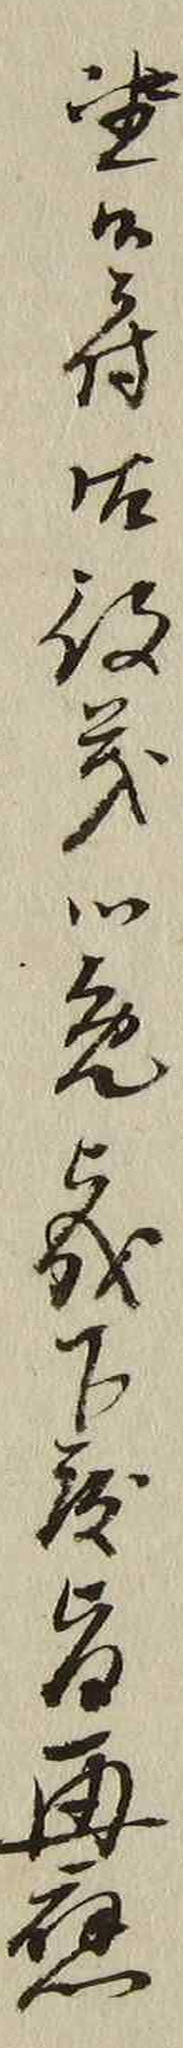坐候ニ付御役義御免被成下度旨再応
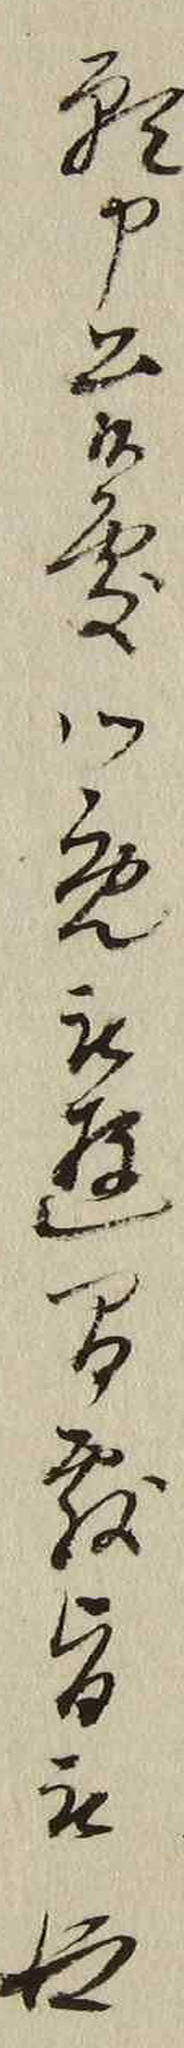願申出候処御免被遊間敷旨被仰
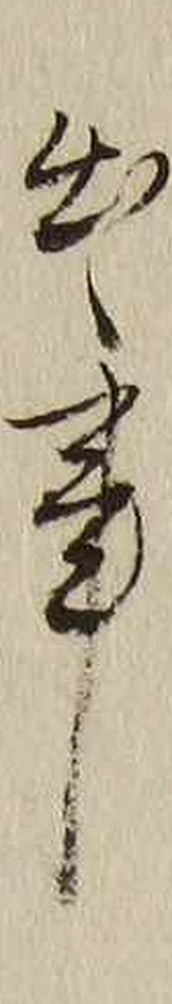出候事
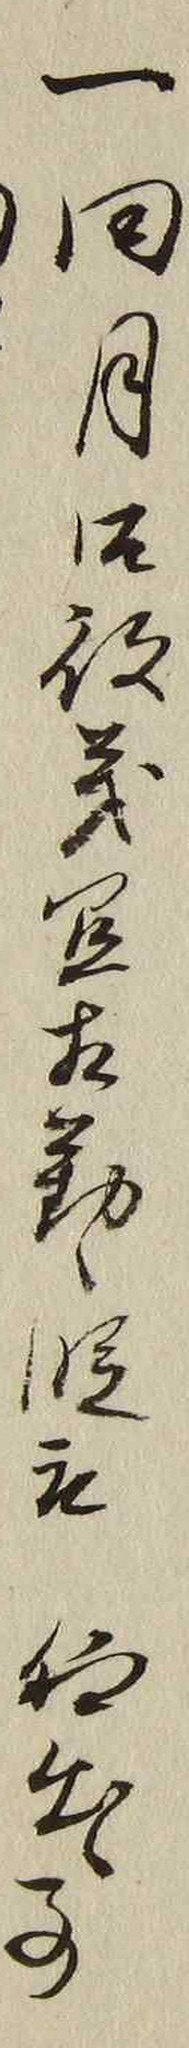一同月御役義宜相勤候段被仰出候事
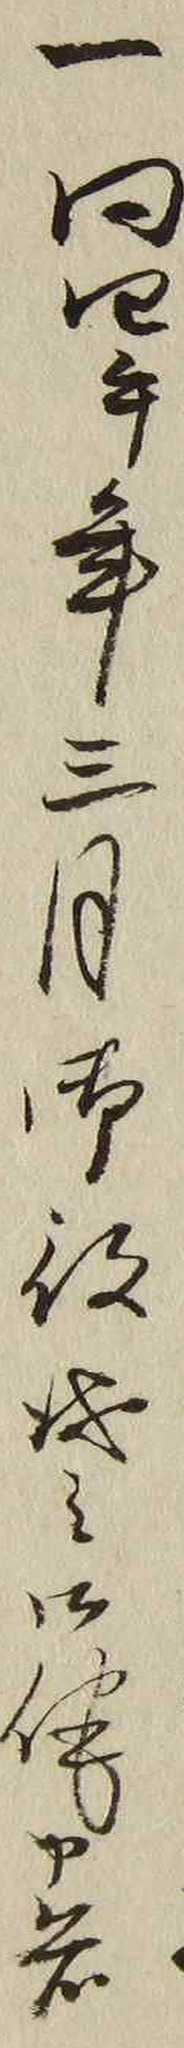一同四午年三月御役儀之御侘申上候
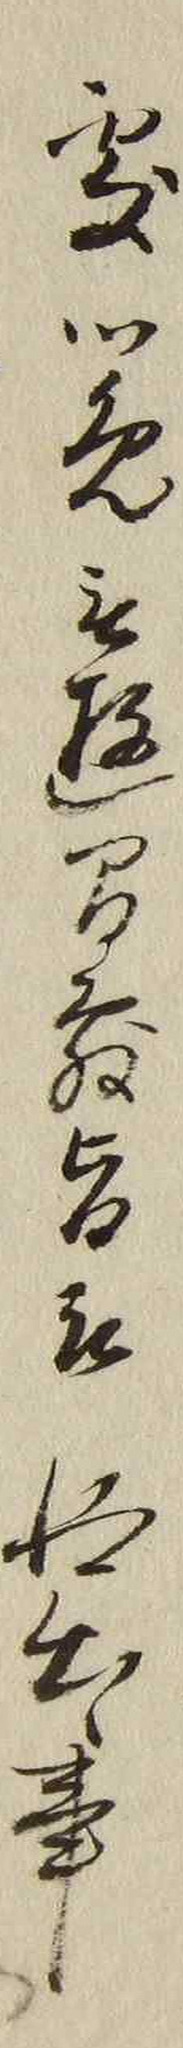処御免被遊間敷旨被仰出候事
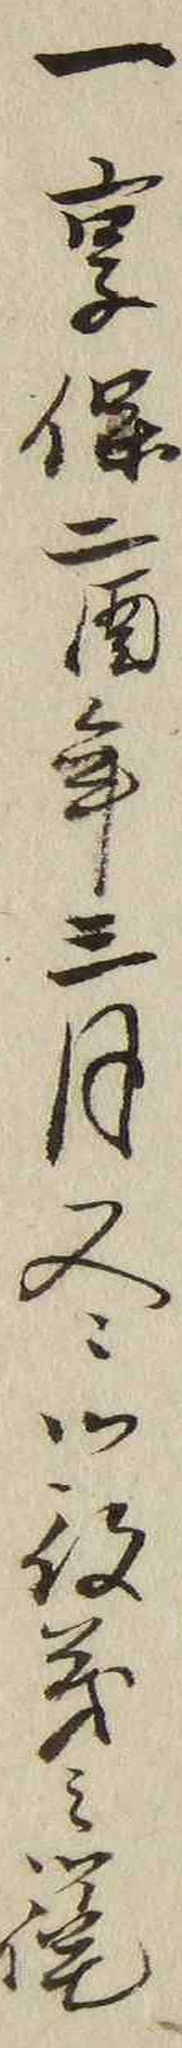一享保二酉年三月又々御役義之御侘

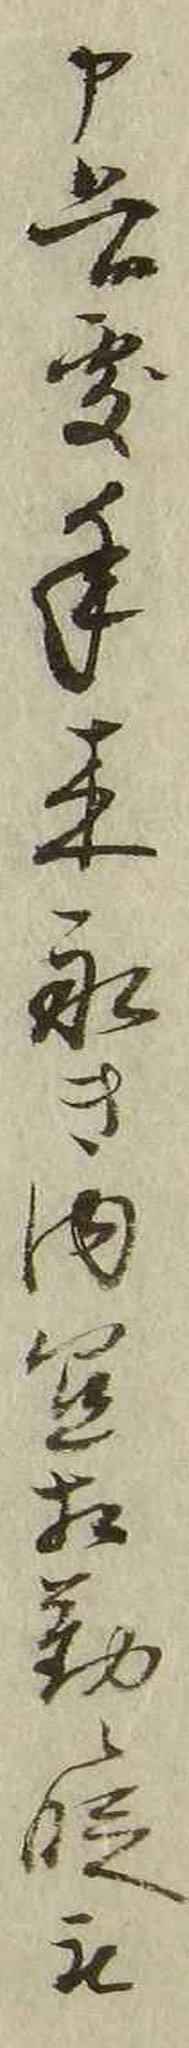申上候処年来永き内宜相勤候段被
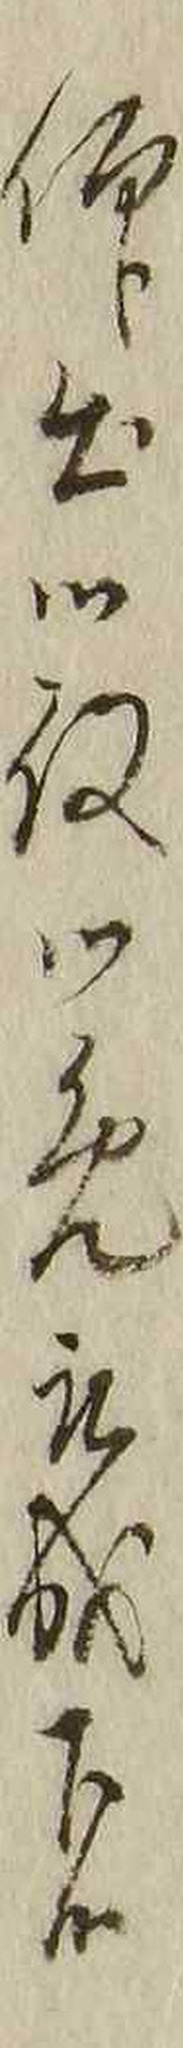仰出御役御免被成下候
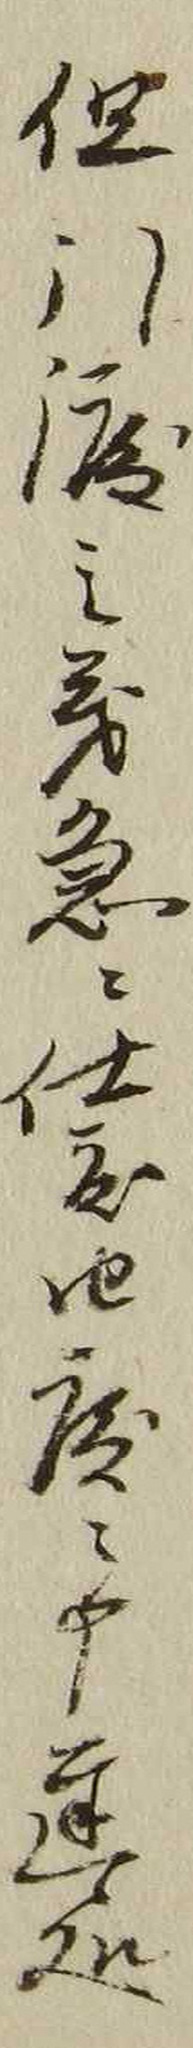但引渡之義急ニ仕度由度々申達候処
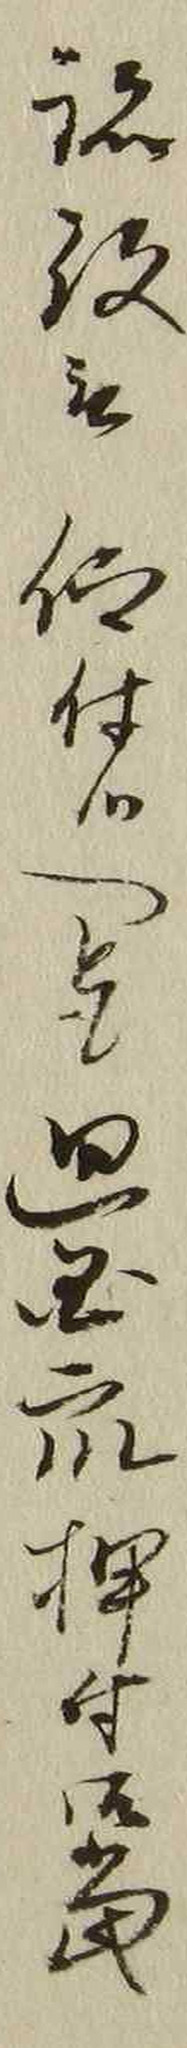跡役被仰付候へとも廻国衆押付御当
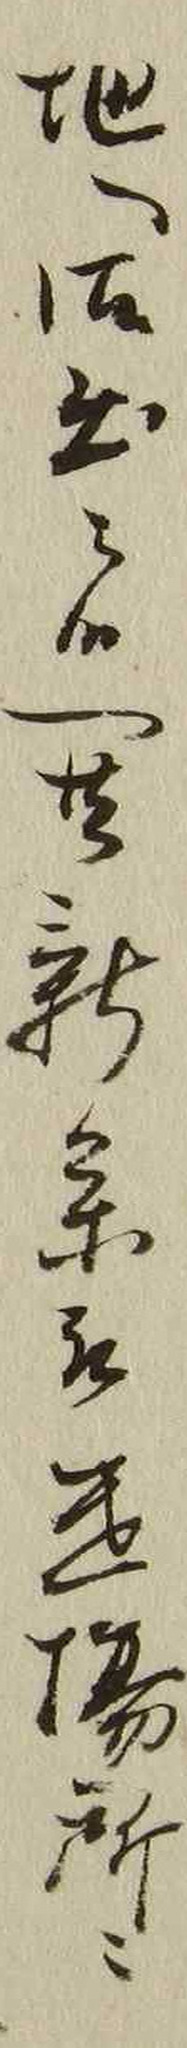地へ御出ニ候へ共新参被遣場所ニ
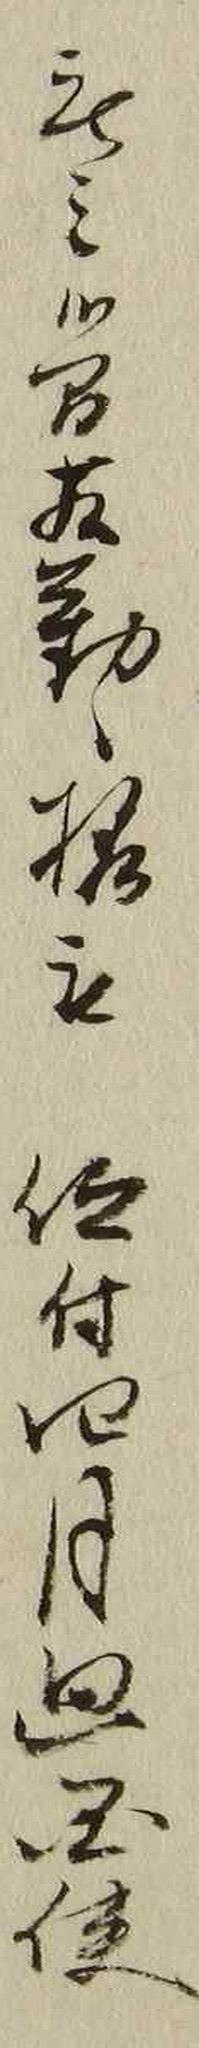無之候間相勤候様被仰付四月廻国使
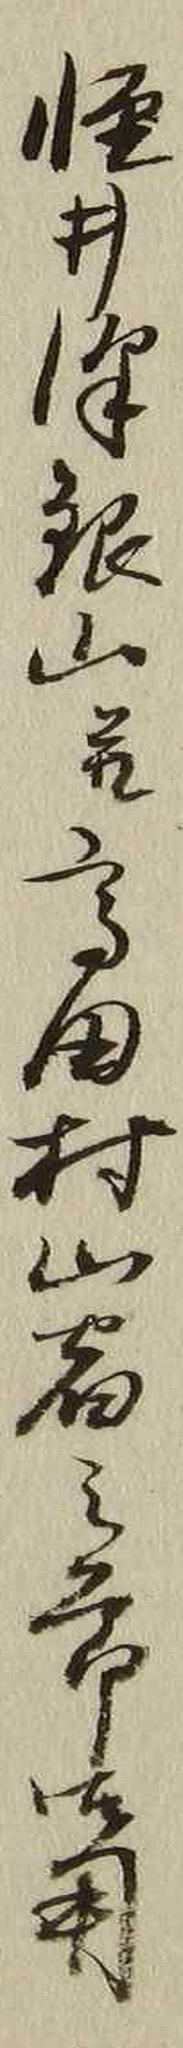軽井沢銀山并高田村山宿之節御用
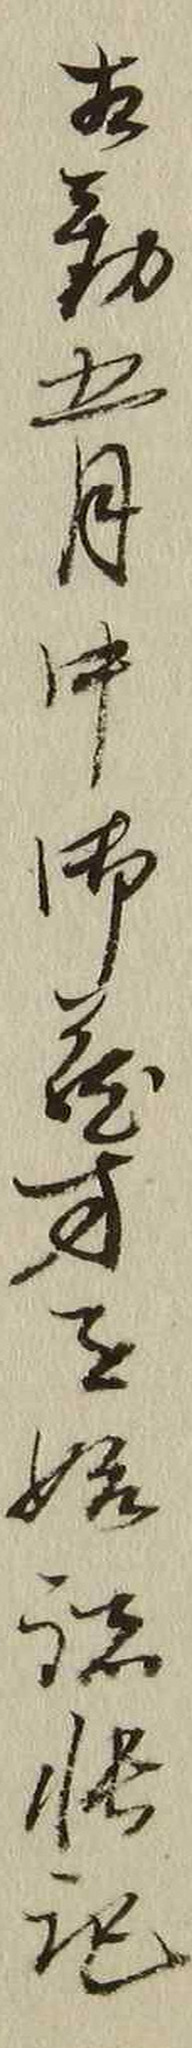相勤五月中御蔵方を始諸帳記
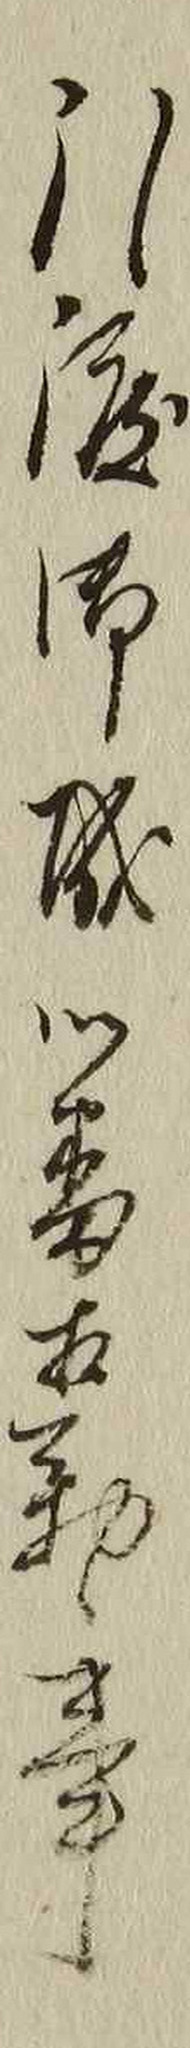引渡御城御番相勤候事
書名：諸士系譜　巻之359　す之部9
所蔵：会津若松市立会津図書館
